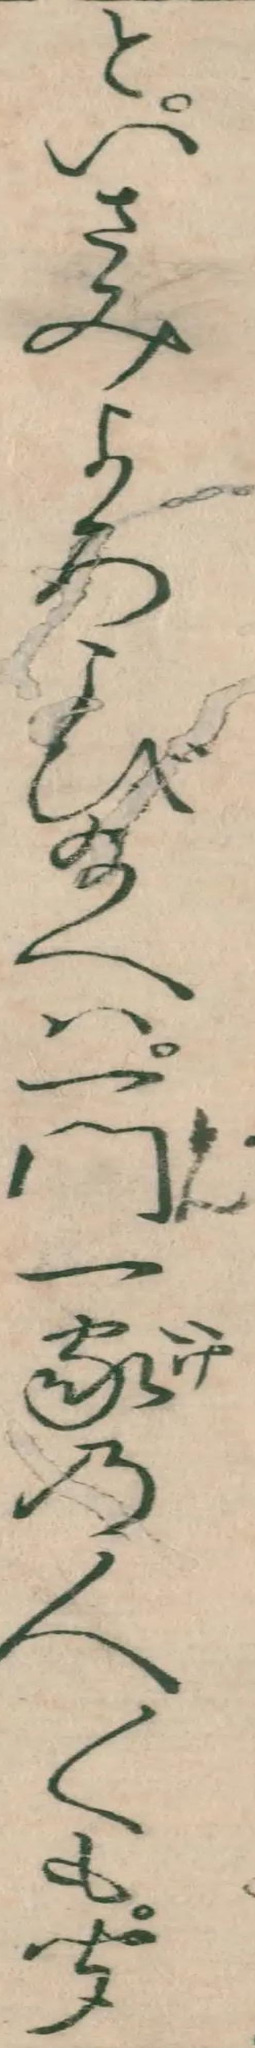と。いさみよろこび給へは。一門一家の人〳〵も聞
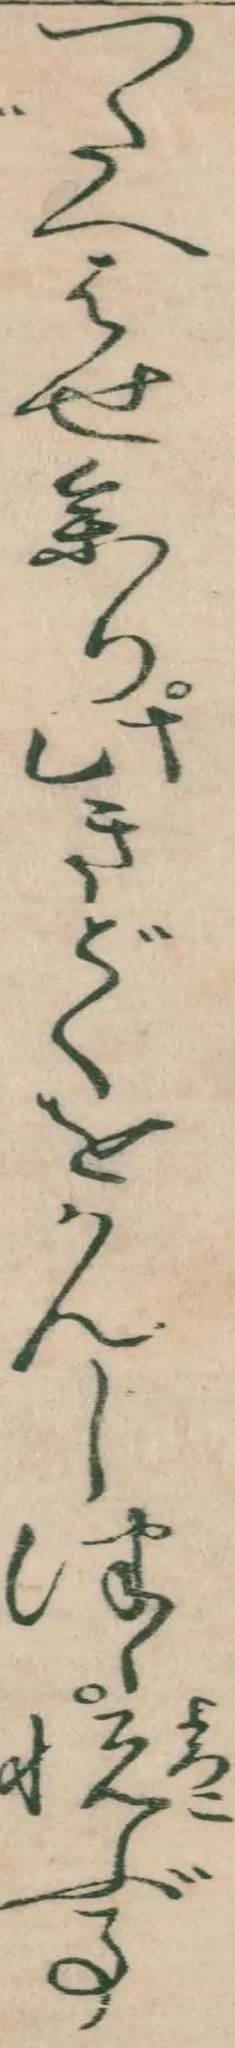つたへはせ参り。此きどくをかんしつゝ。悦ぶ事
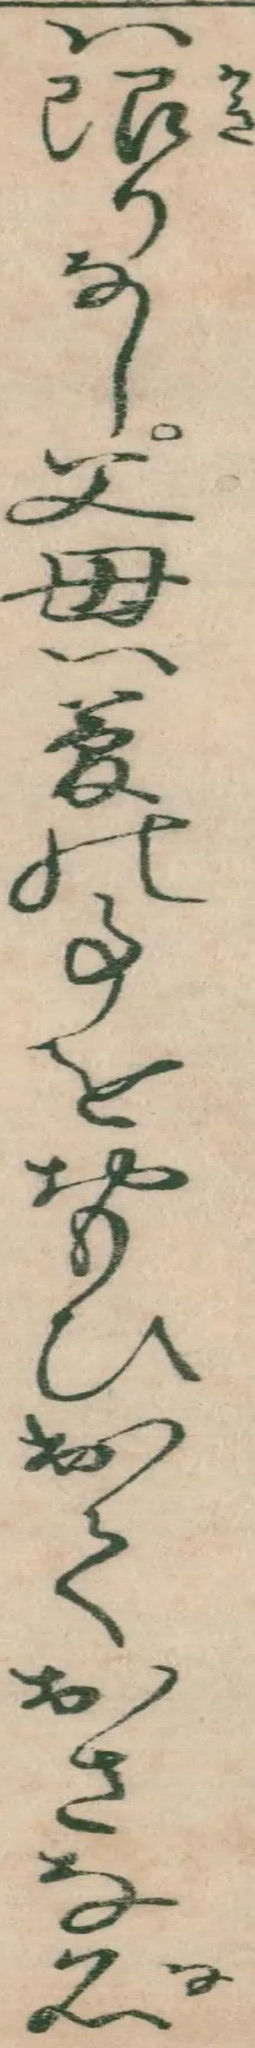は限りなし。父母は夢の事をおもひ出ておさな名
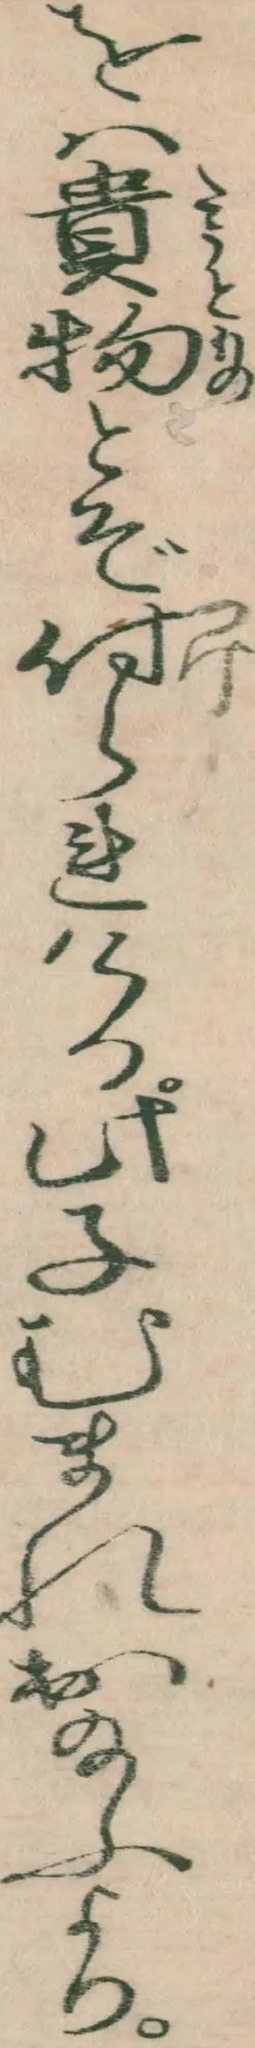をは貴物とぞ付られける。此子むまれ出給ふより。
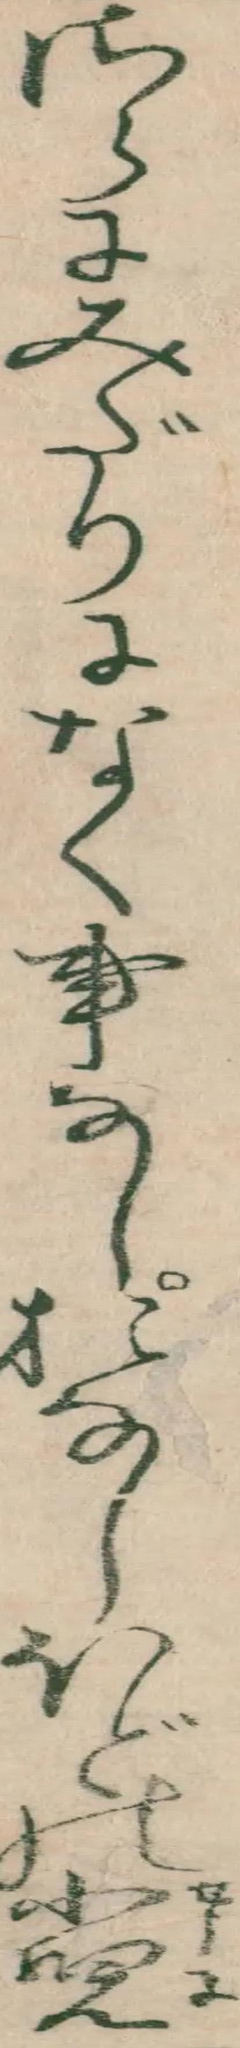さらにみだりになく事なし。おなしほどの小児
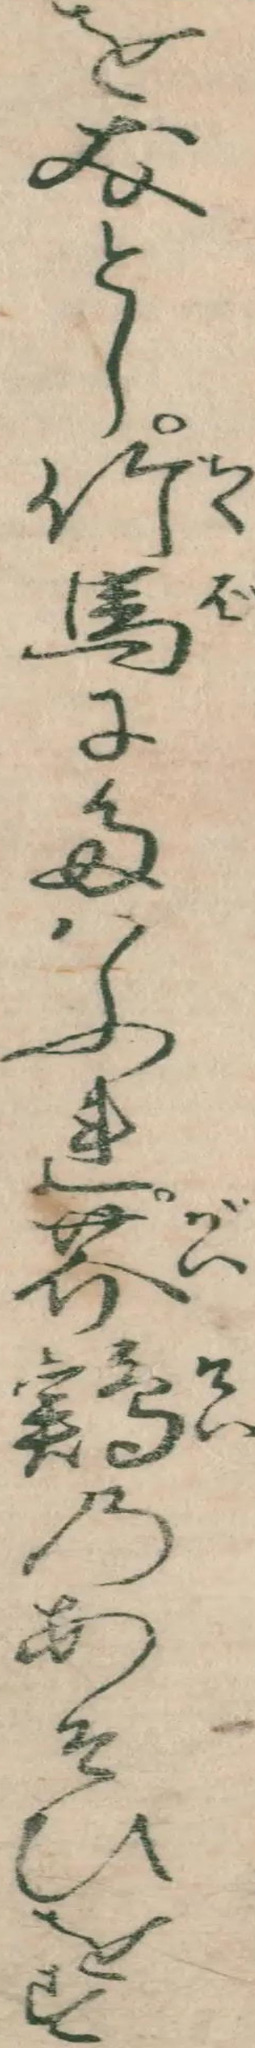を友とし。竹馬にたはふれ芥鶏のあそひをす
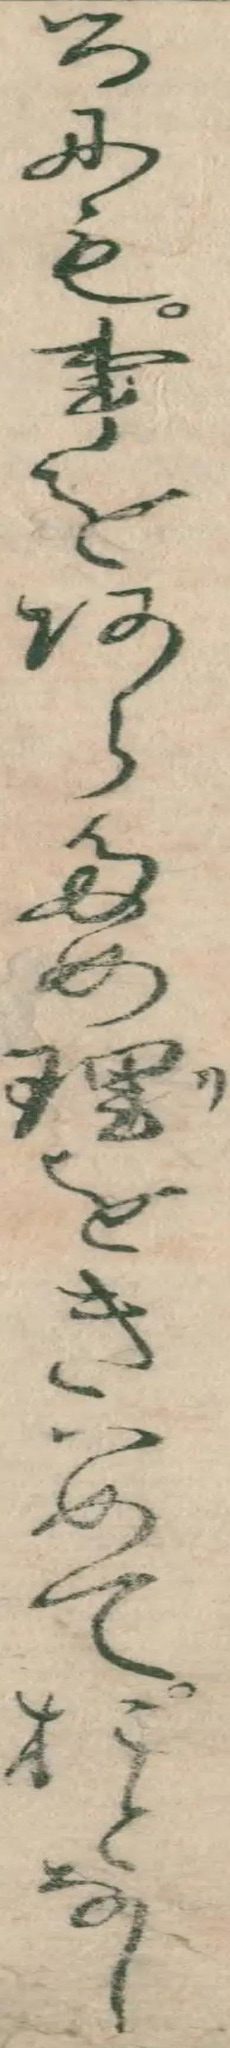るにも。事をあらため理をきはめておとなし
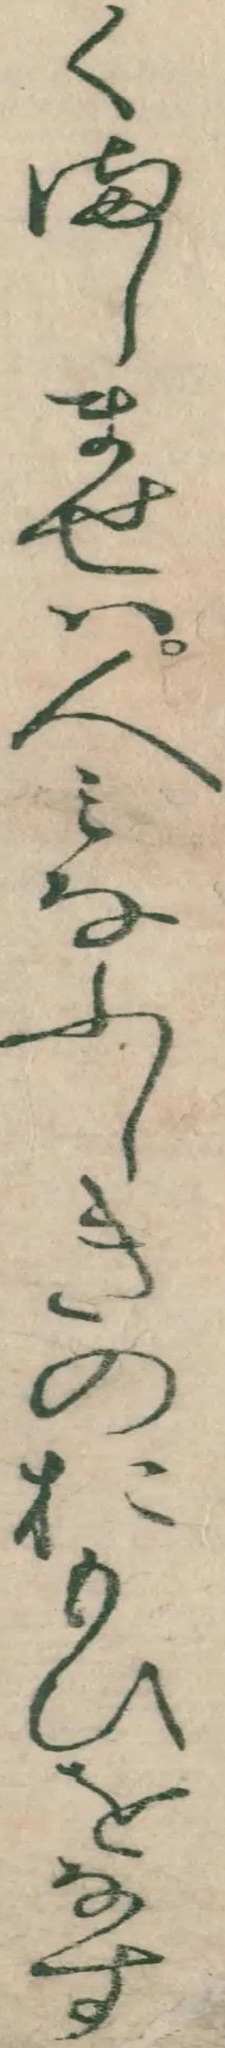くましませは。人みなふしきのおもひをなす

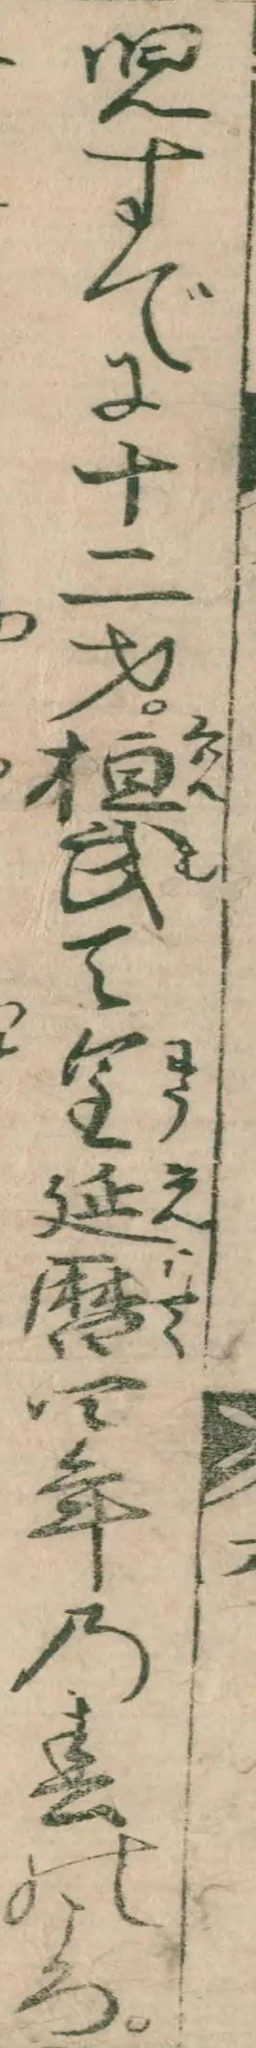児すでに十二才。桓武天皇延暦四年の春のころ。
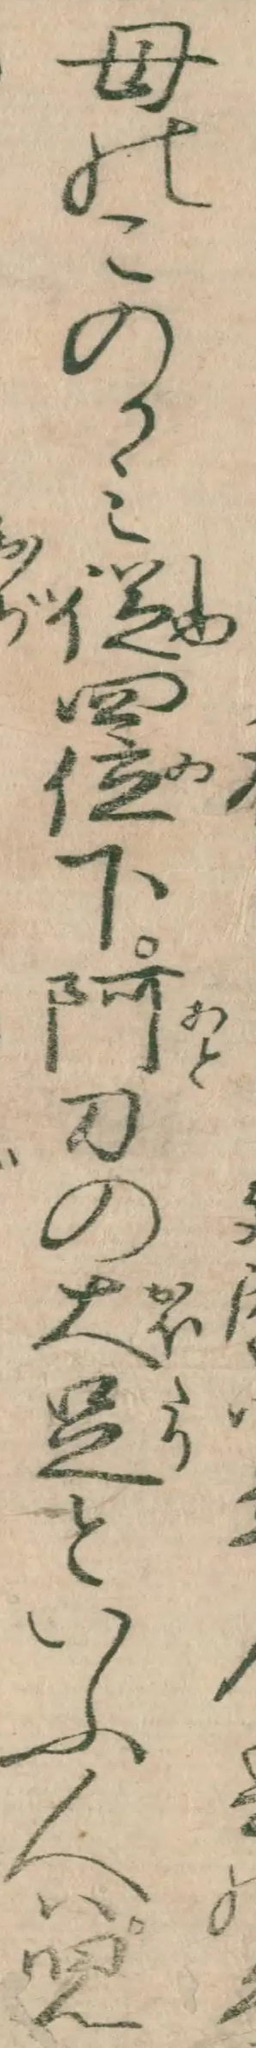母のこのかみ従四位下。阿刀の大足といふ人は。児
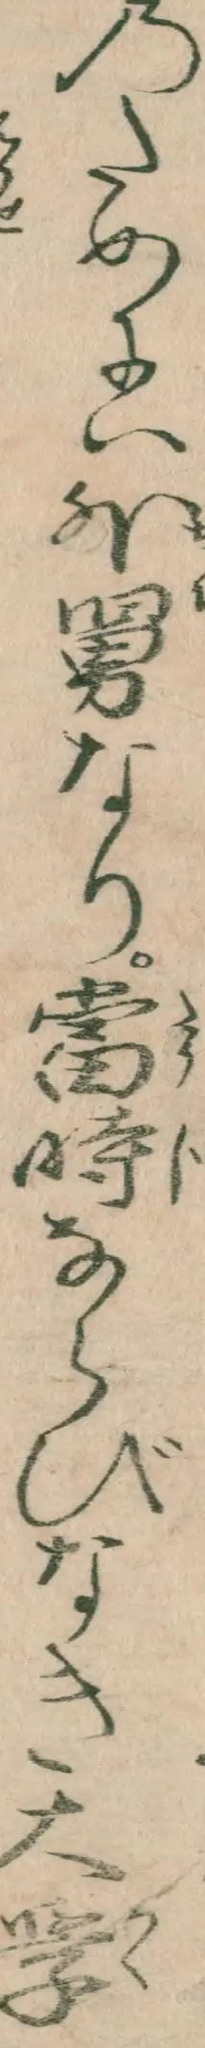のためには外舅なり。当時ならびなき大学
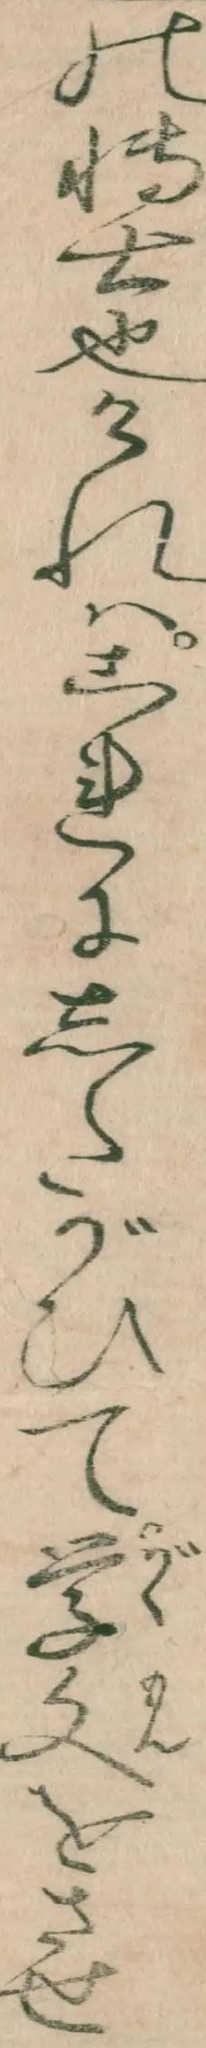の博士也けれは。これにしたがひて。学文をさせ
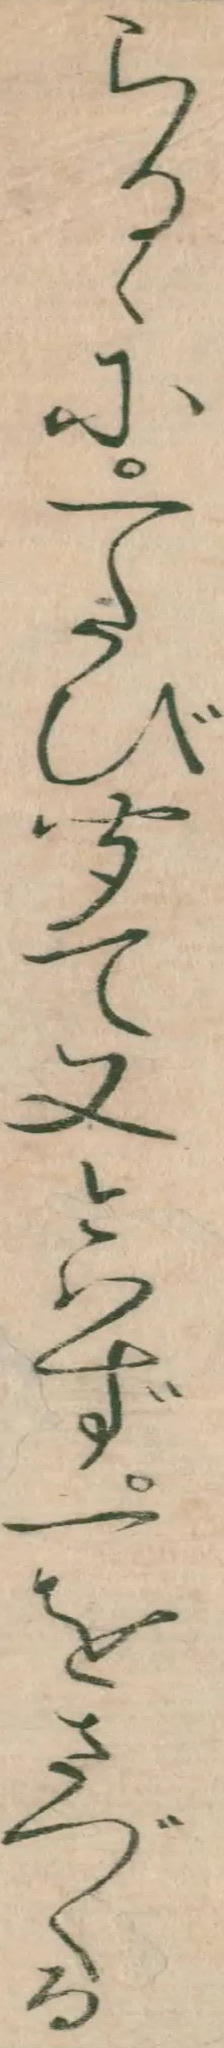らるゝに。一たび聞て又とはず。一をさづくる
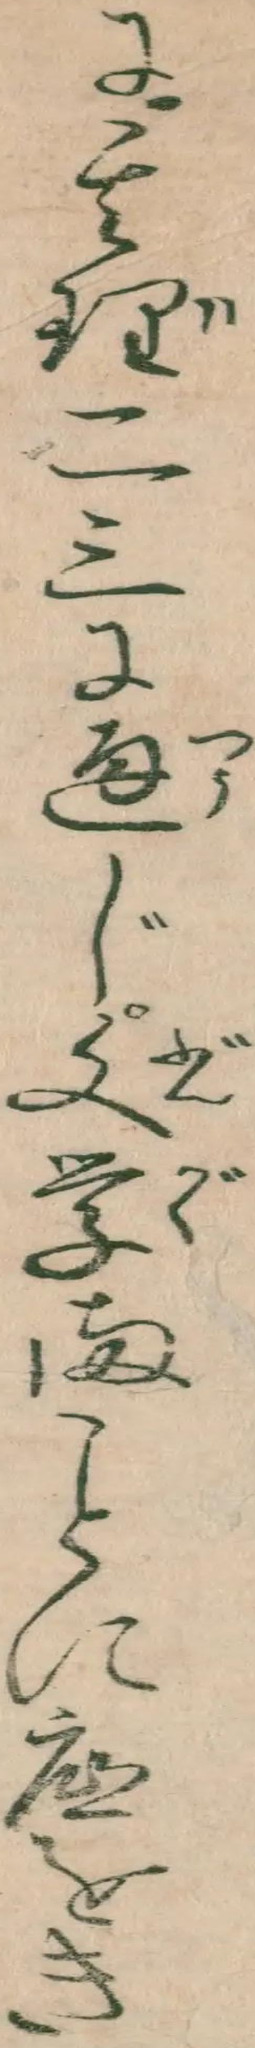に。其理二三に通じ。文学まことに底をき
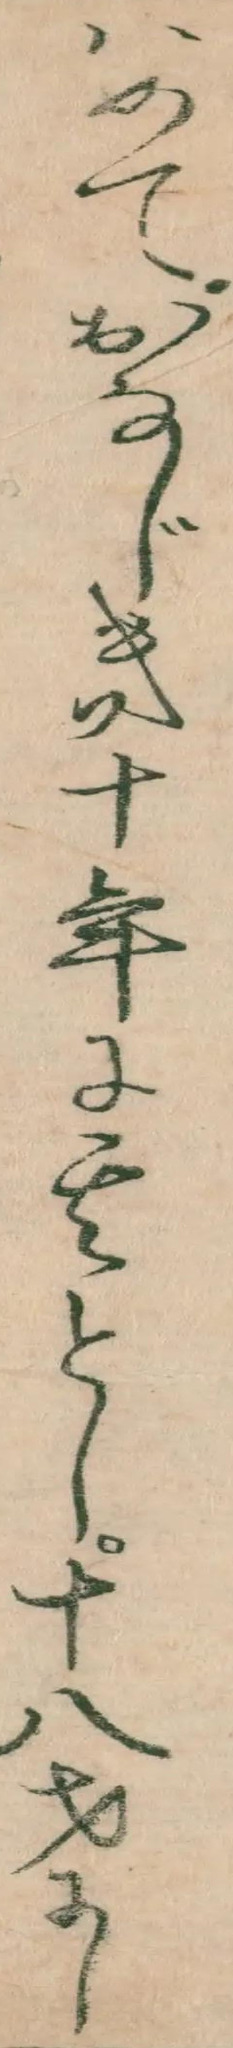はめて。おなじき十年に其とし。十八才にし
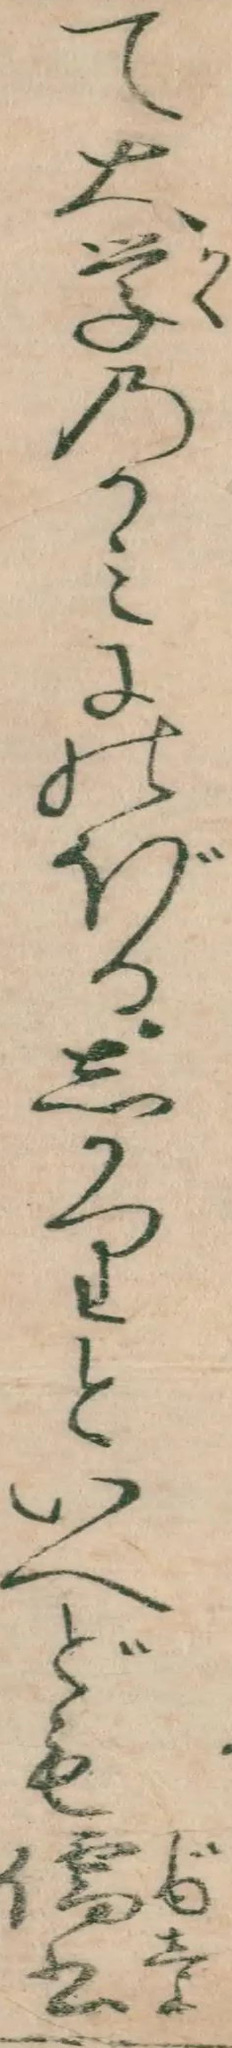て大学のかみにのぼる。しかりといへども儒書
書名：弘法大師御本地 3巻. [1]
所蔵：国立国会図書館 National Diet Library, JAPAN
